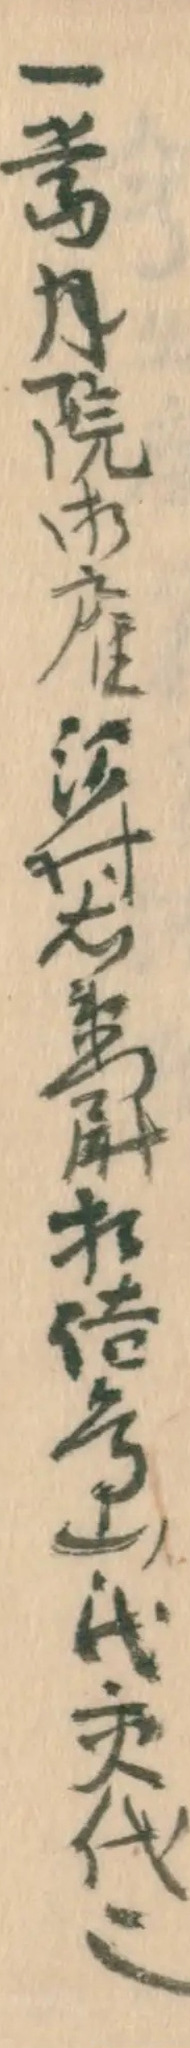一当月院御雇沢村右衛門尉相詰鳥山氏交代也
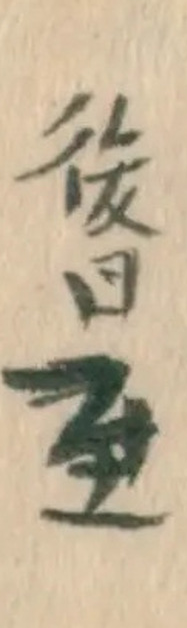後日至
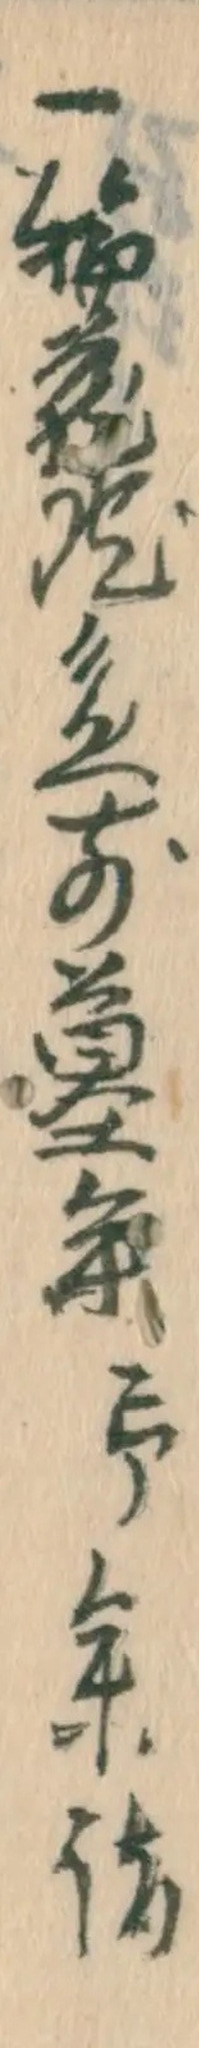一輪蔵院盆前墓参予参詣
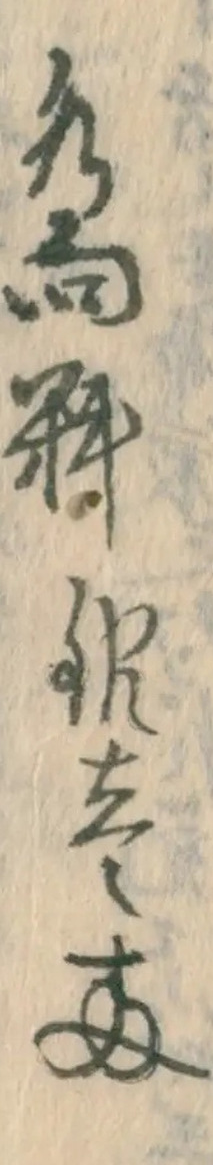水向料銀壱両
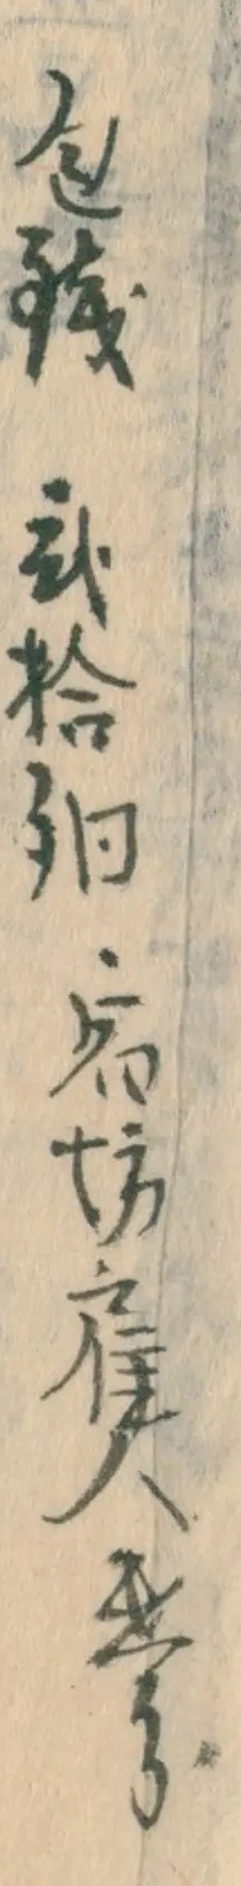包銭弐拾銅宿坊雇人遣分
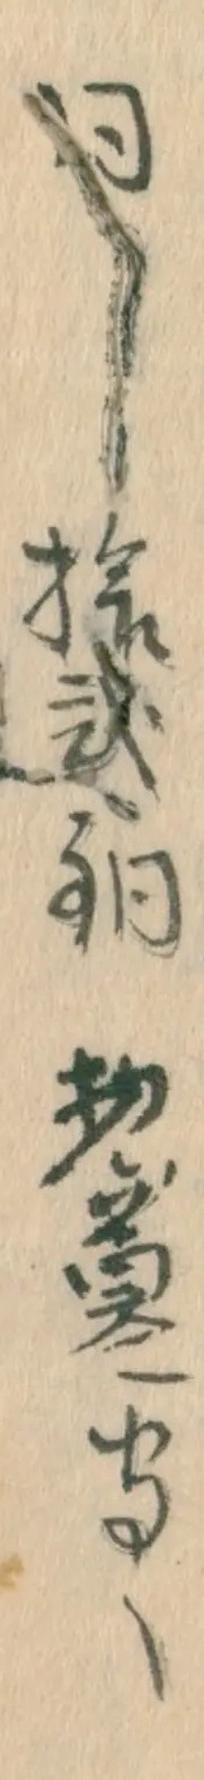同弐拾銅惣墓守へ
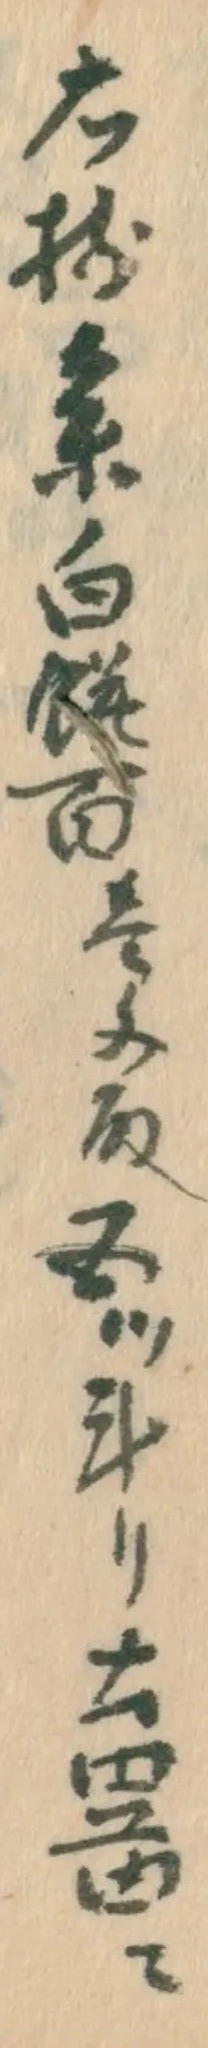右持参白餅百壱文故五ツ計り土器ニ

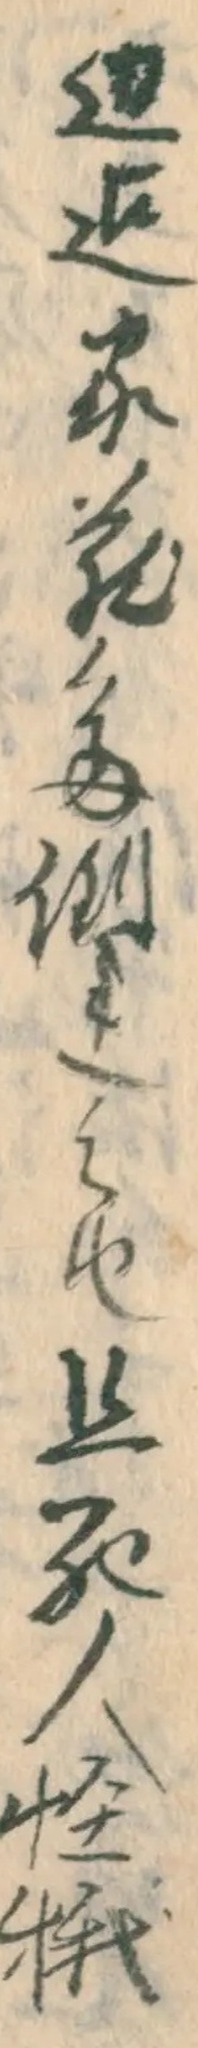辺迄家蔵多倒れ之由且死人怪我
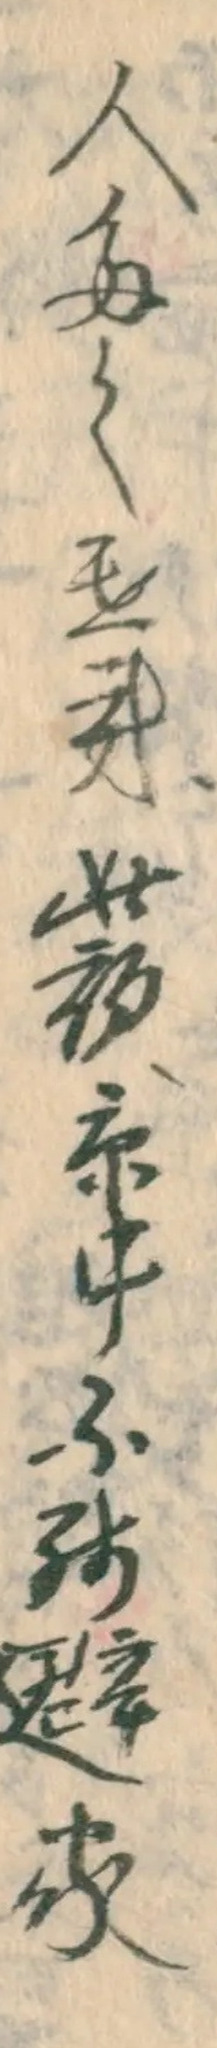人多之遣来此夜京中不残避家
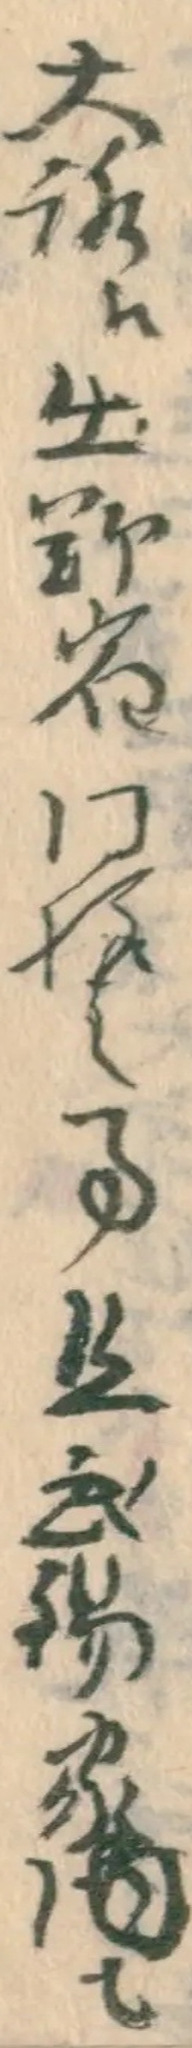大路え出野宿同様之事且武錫家内も
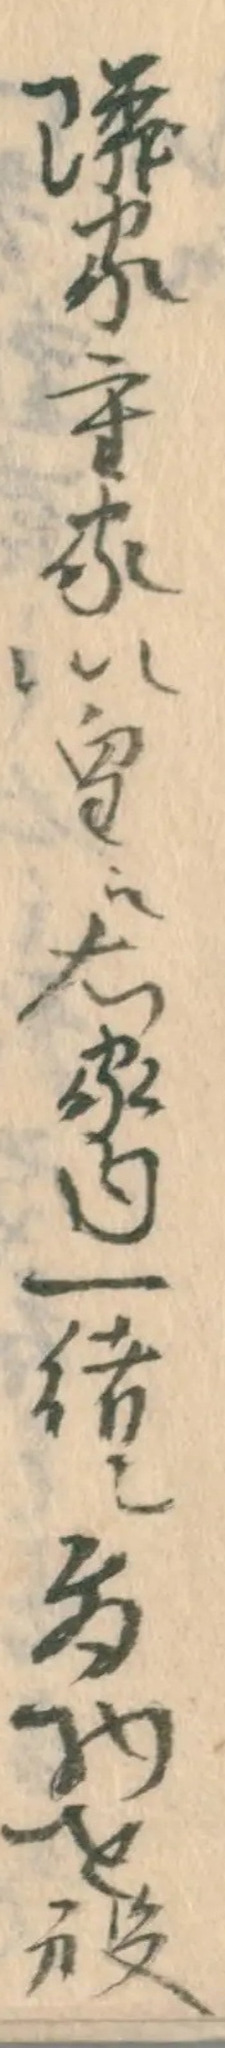隣家重家川辺え右家内一緒ニ敷物を設
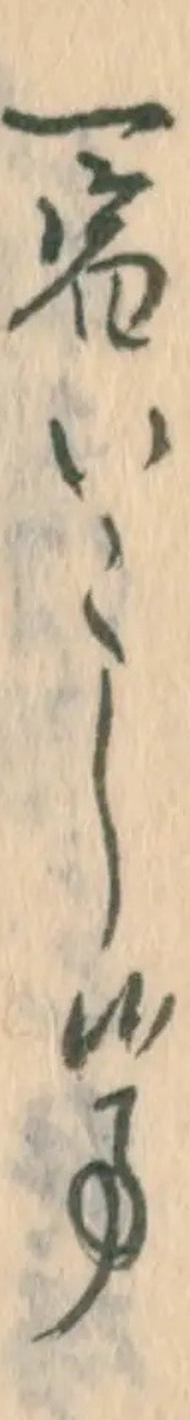一宿いたし候事
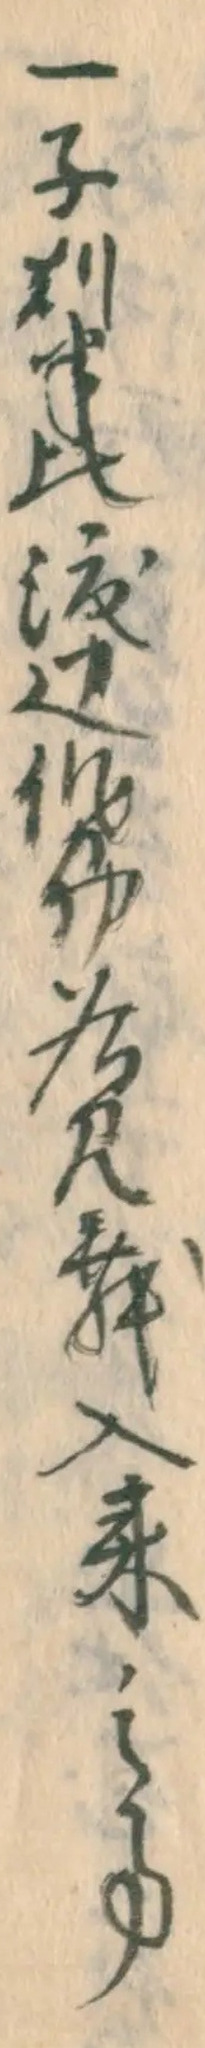一子刻半頃渡辺作州為見舞入来之事
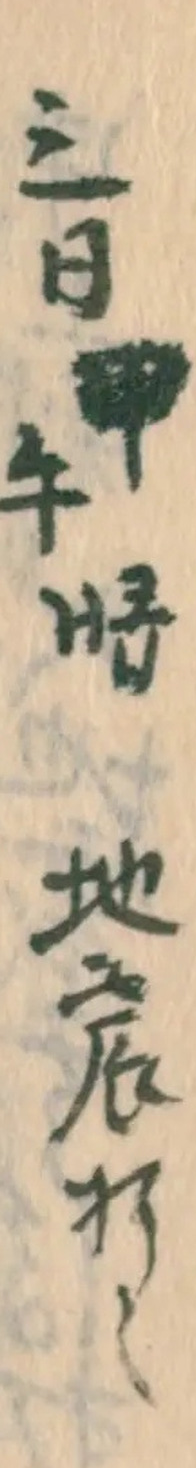三日甲午晴地震折々
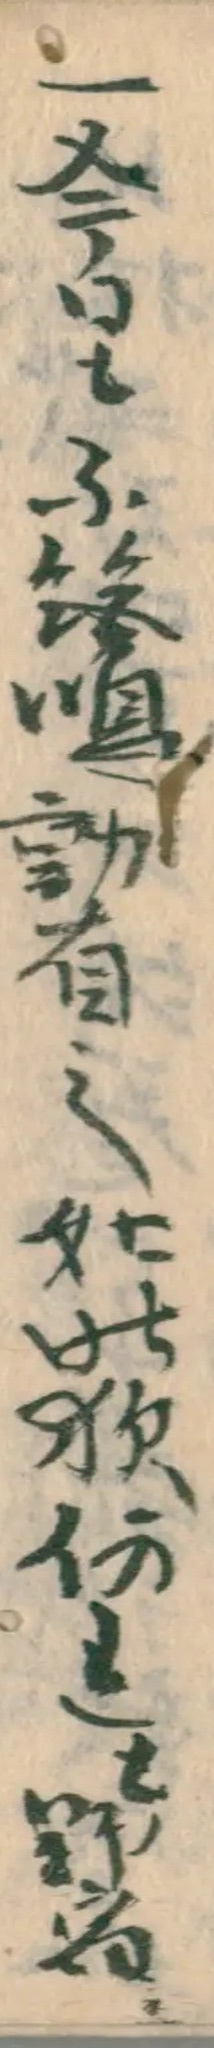一今日も不絶鳴動有之如昨夜何れも野宿
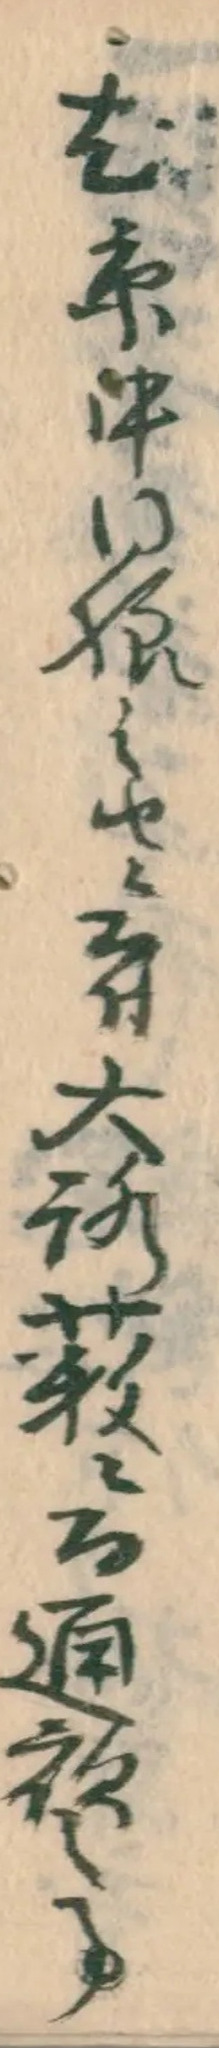尤京中同様之由ニ付大路薮ニ而通夜之事
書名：禁裏御所御用日記. [131]
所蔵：国立国会図書館 National Diet Library, JAPAN
